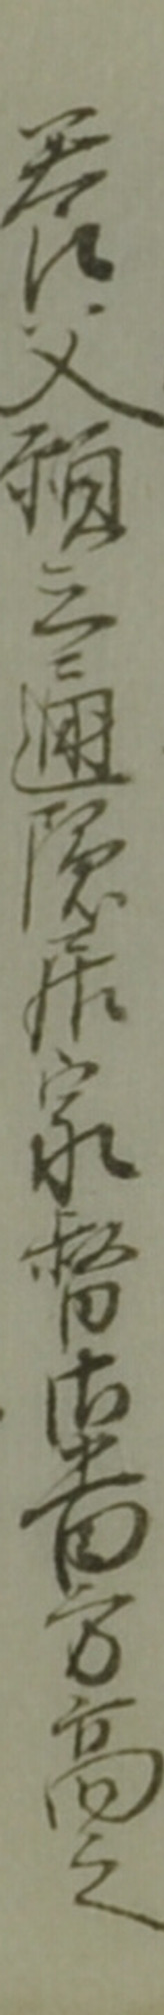養父願之通隠居家督御番方高之
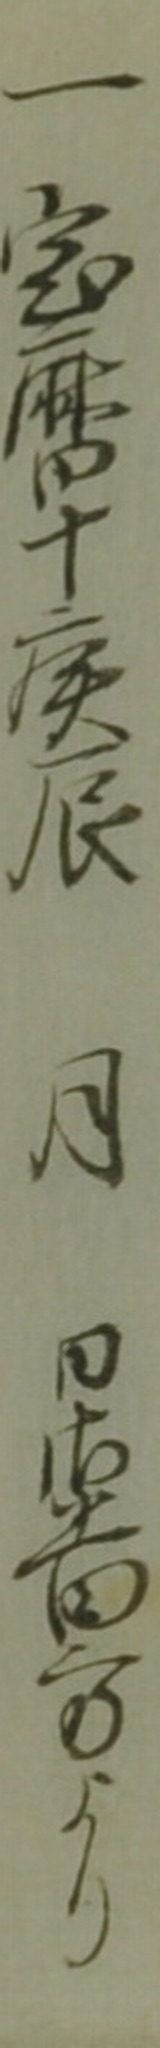一宝暦十庚辰月日御番方より
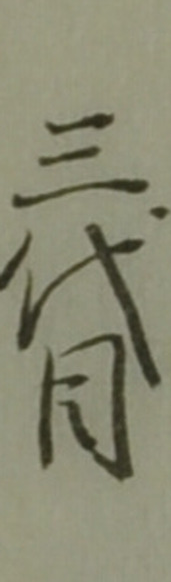三代目
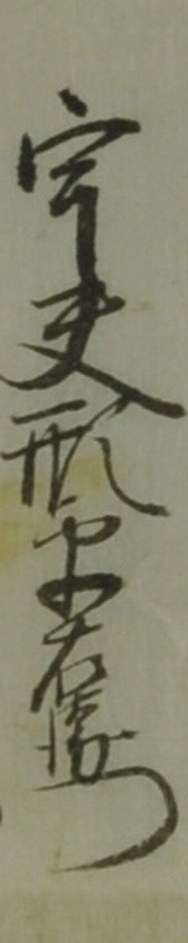宇夫形平右衛門
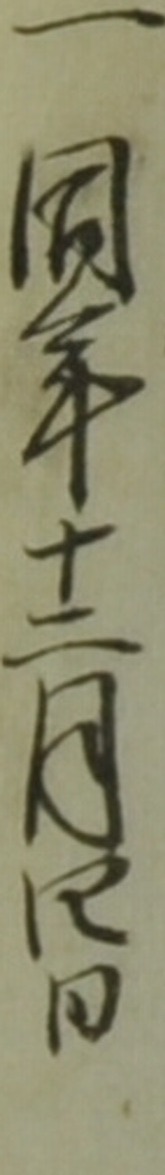一同年十二月四日
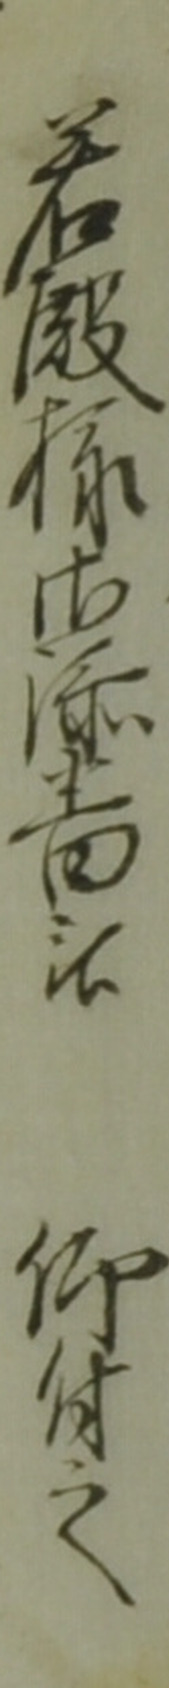若殿様御添番被仰付之
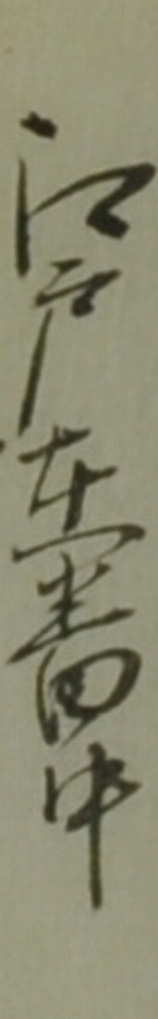江戸在番中

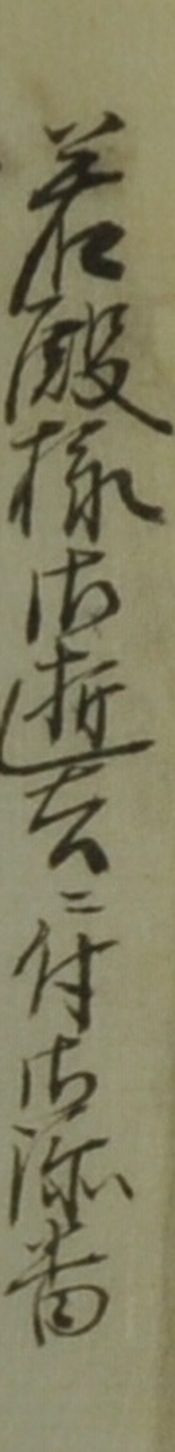若殿様御逝去に付御添番
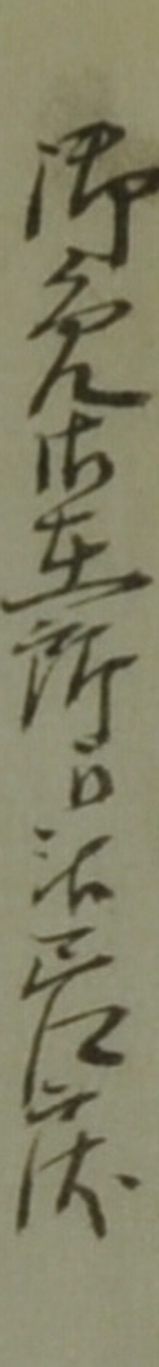御免御在所へ被差戻
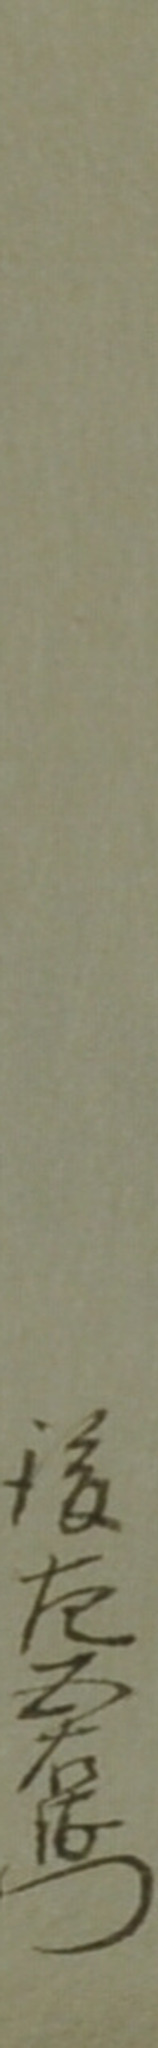後左五右衛門
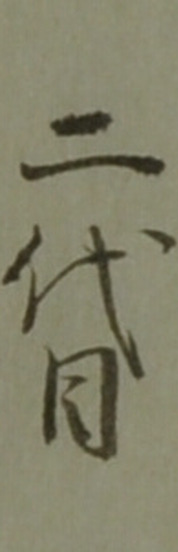二代目
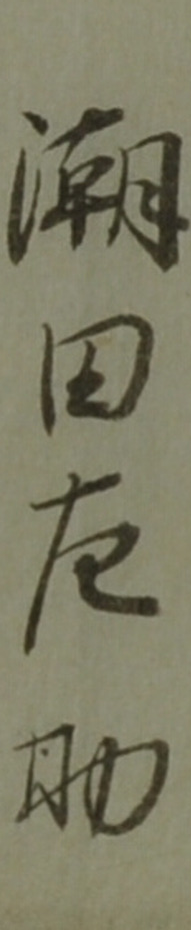潮田左助
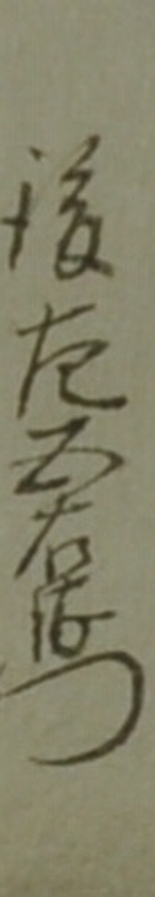後左五右衛門
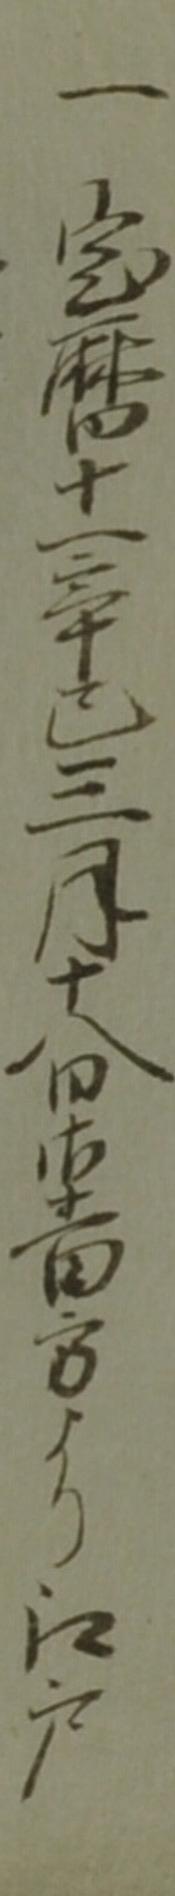一宝暦十一辛巳三月十八日御番方より江戸
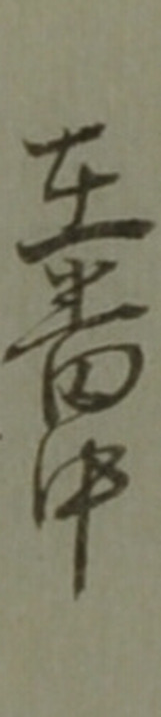在番中
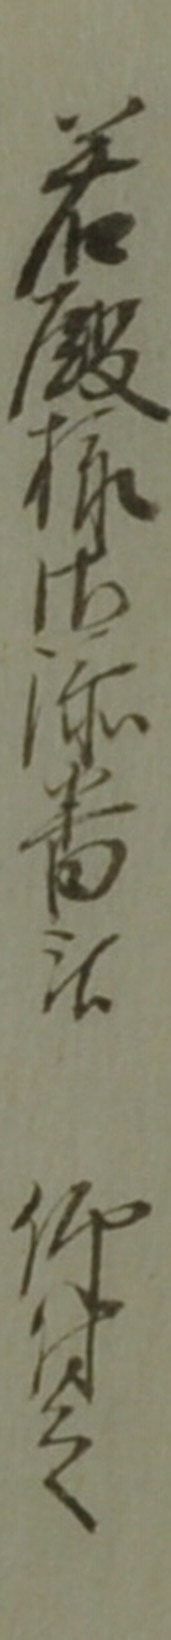若殿様御添番被仰付之
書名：諸御役代々録（八）
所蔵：伊那市立高遠町図書館・合同会社AMANE
